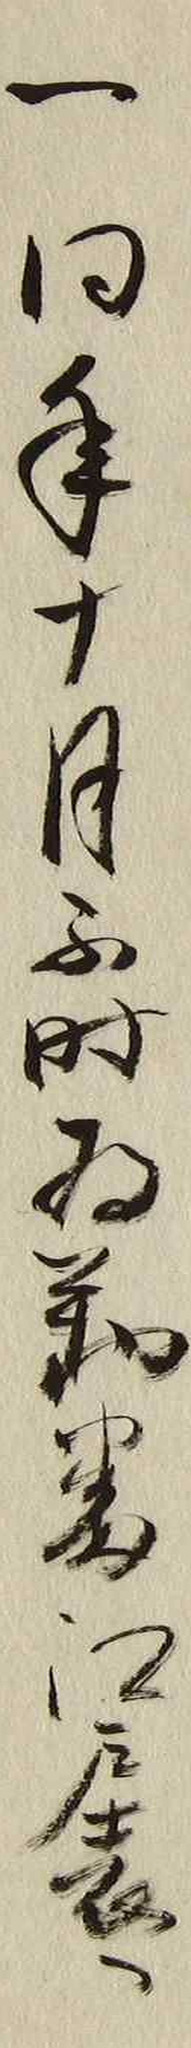一同年十月不時為勤番江戸表へ
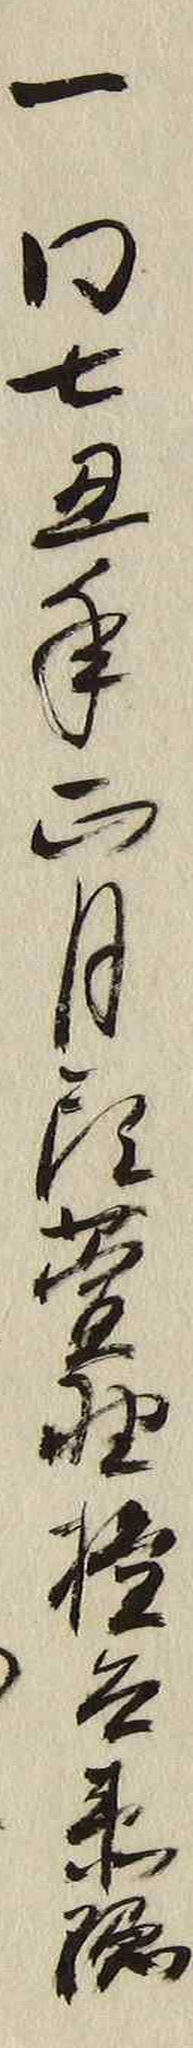一同七丑年六月頭萱野権兵衛隠
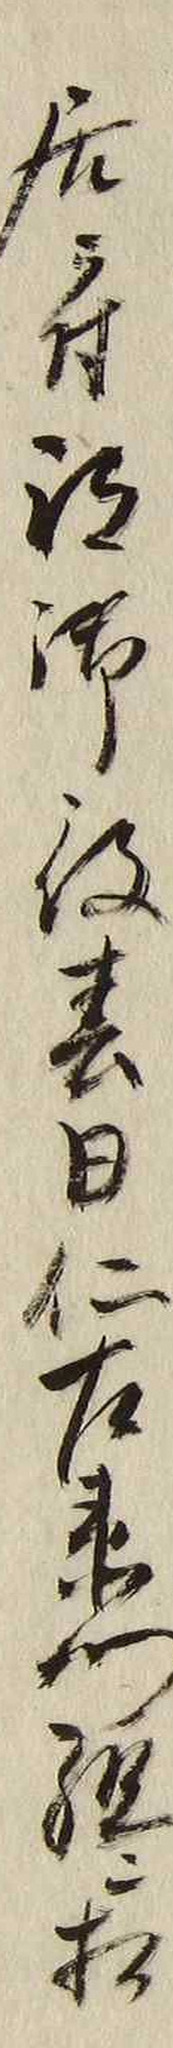居ニ付跡御役春日仁左衛門組ニ相
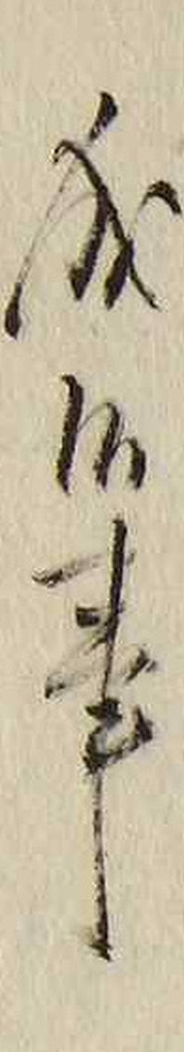成候事

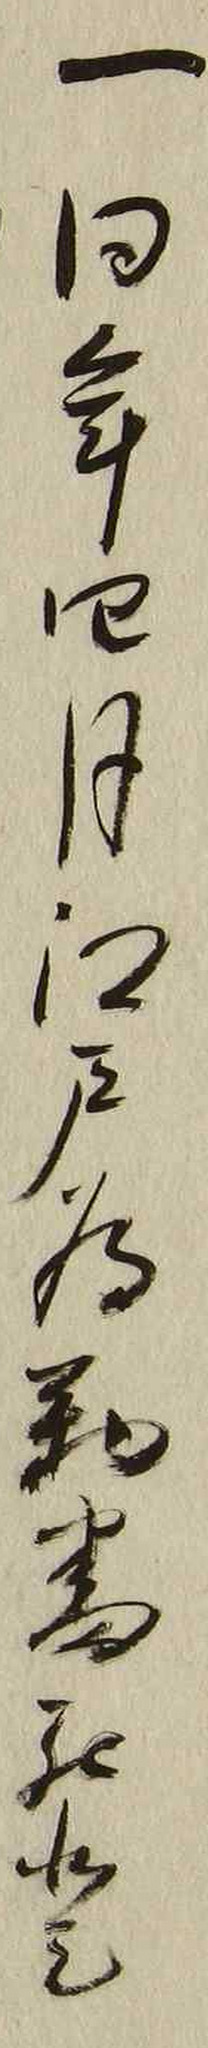一同年四月江戸為勤番罷登
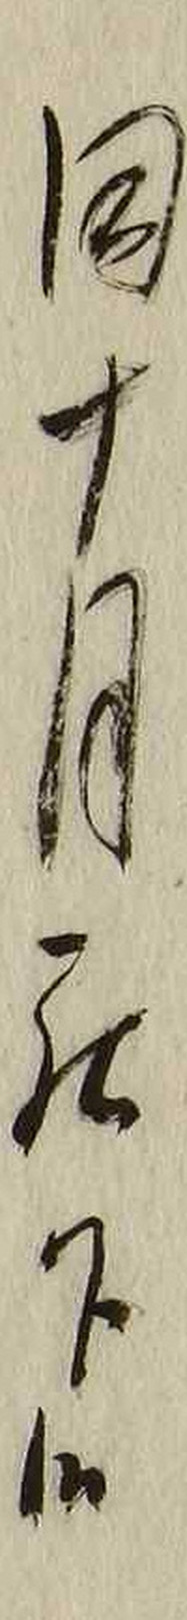同十月罷下候
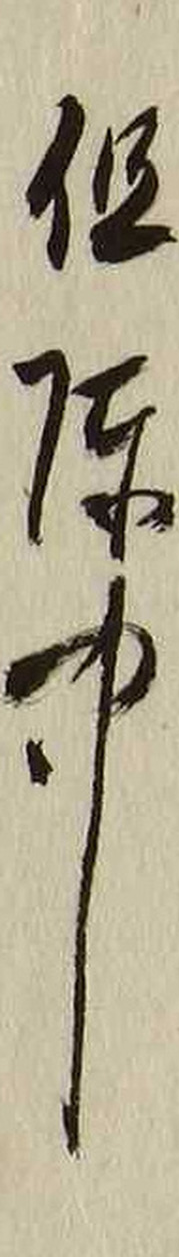但陣中
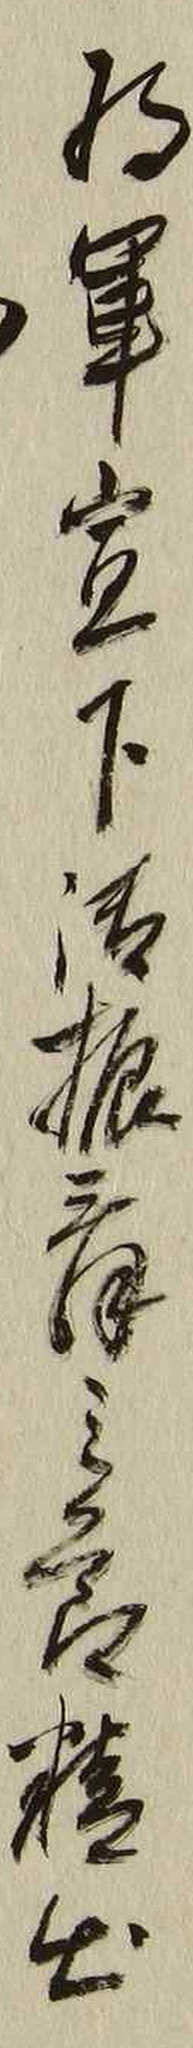将軍宣下御振舞之節精出
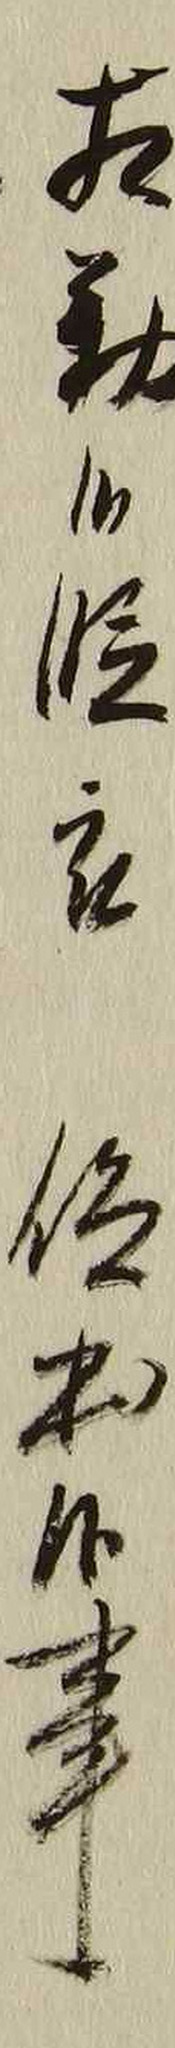相勤候段被仰出候事
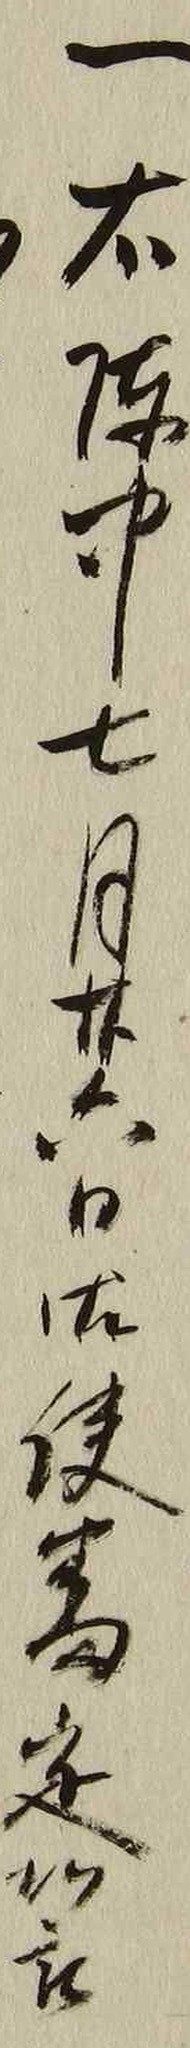一右陣中七月廿六日御使番定被
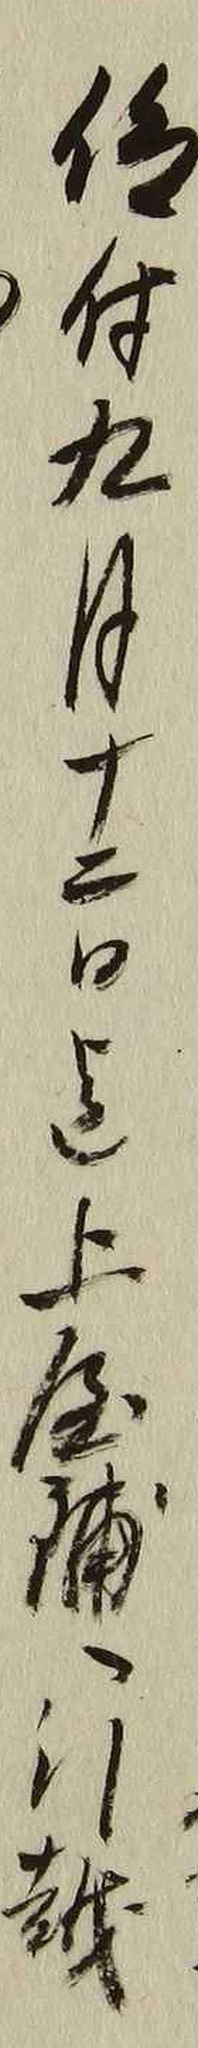仰付九月十二日迄上屋鋪へ引越
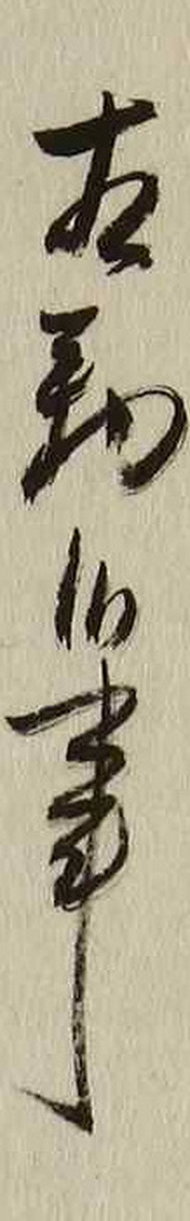相勤候事
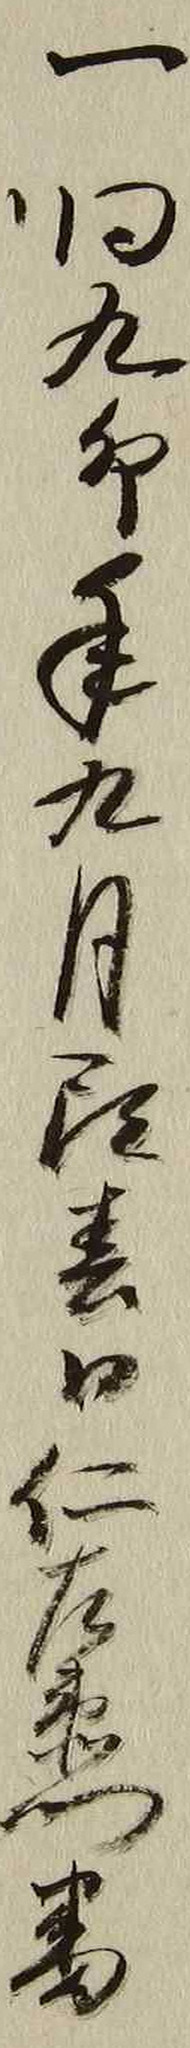一同九卯年九月頭春日仁左衛門番
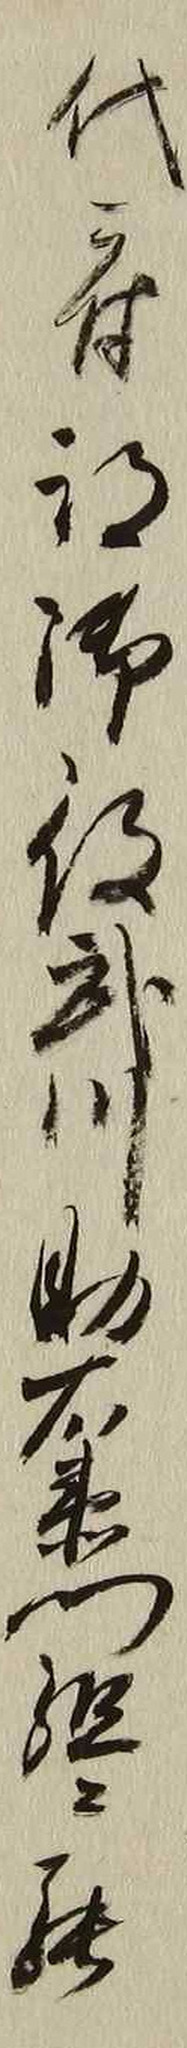代ニ付跡御役武川助右衛門組ニ罷
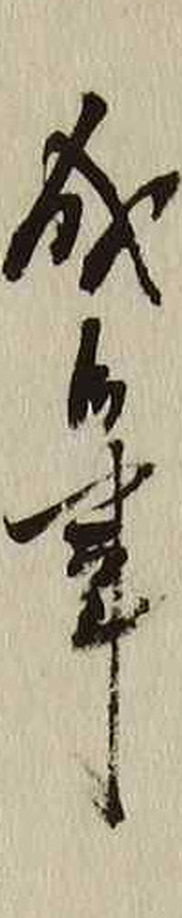成候事
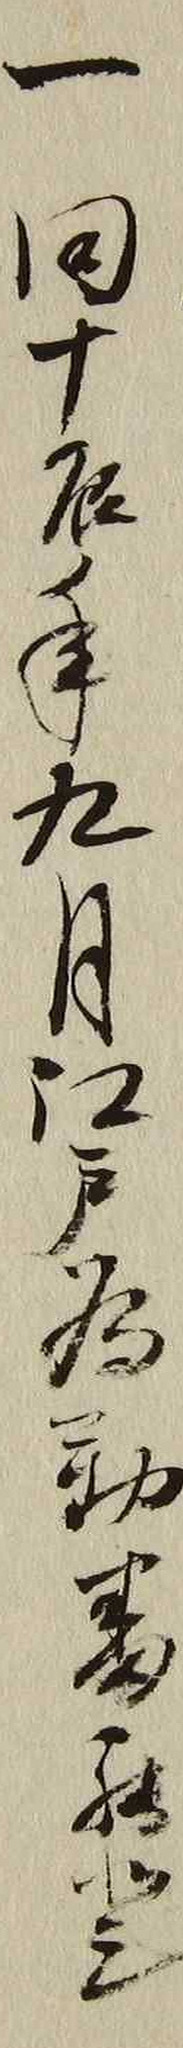一同十辰年九月江戸為勤番罷登
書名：諸士系譜　巻之349　も之部5
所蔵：会津若松市立会津図書館
